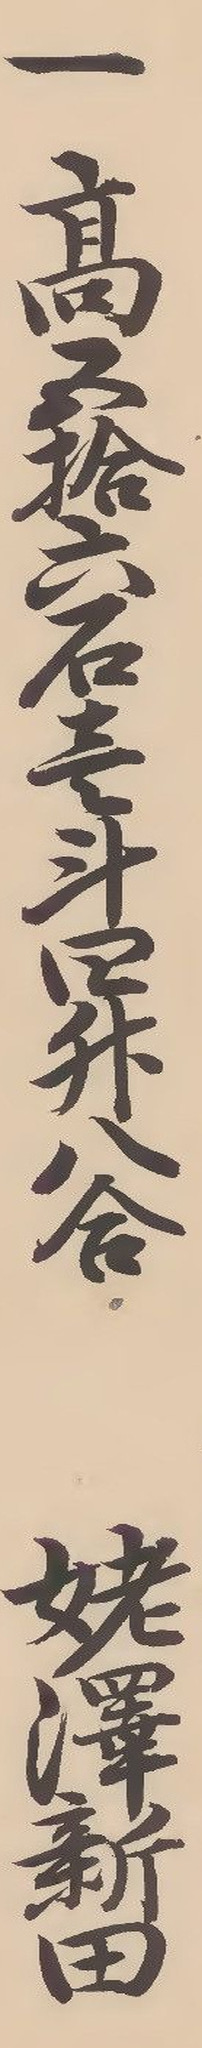一高五拾六石壱斗四升八合姥沢新田

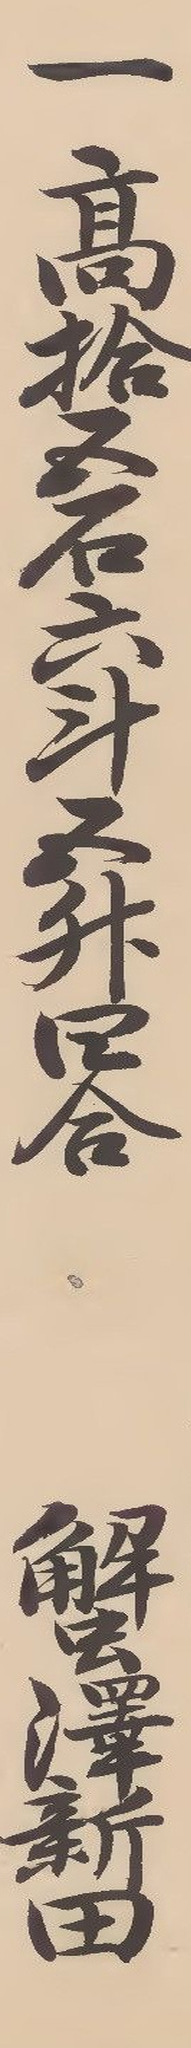一高拾五石六斗五升四合蟹沢新田
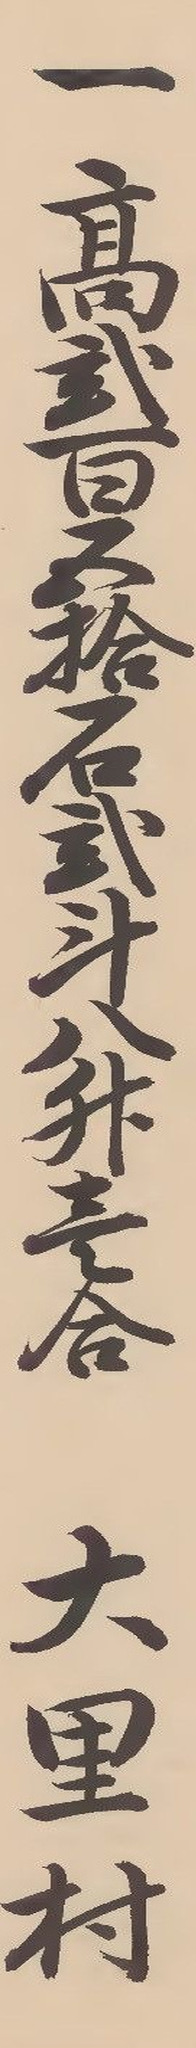一高弐百五拾石弐斗八升壱合大里村
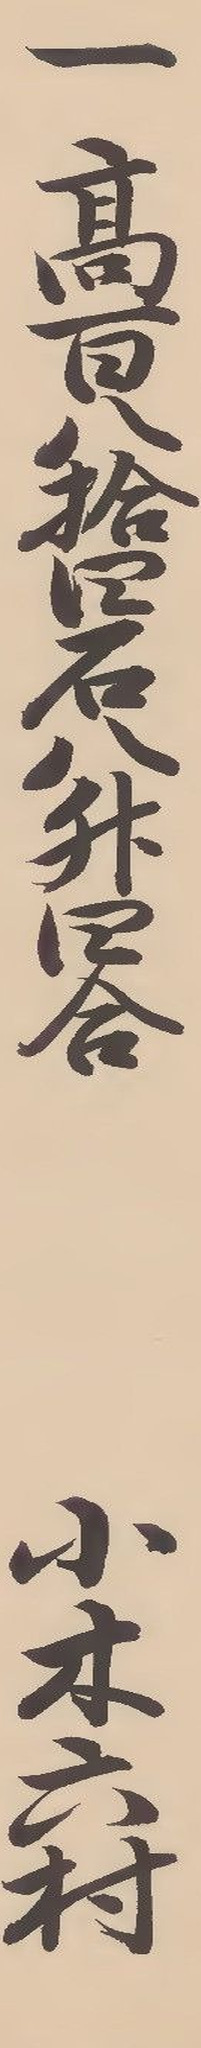一高百八拾四石八升四合小木六村
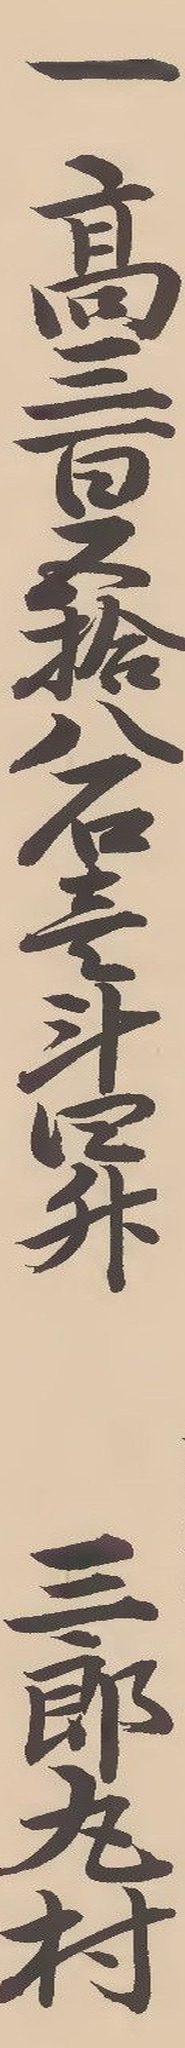一高三百五拾八石壱斗四升三郎丸村
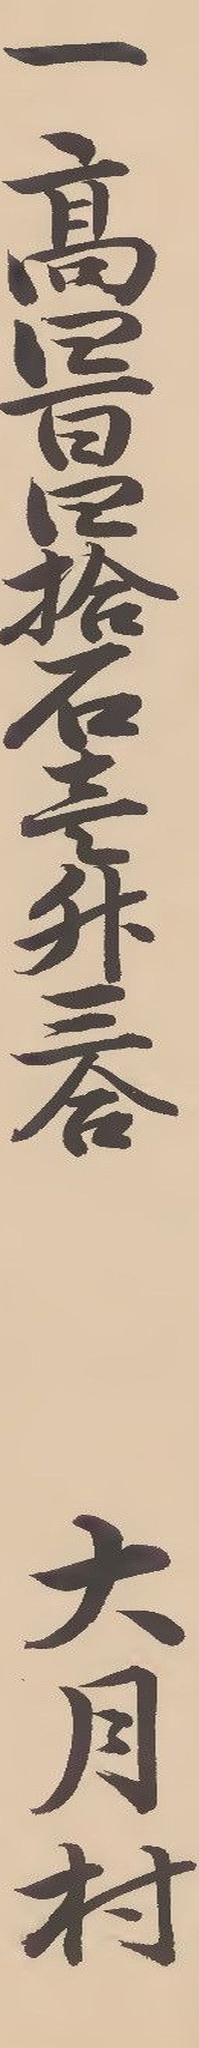一高四百四拾石壱升三合大月村
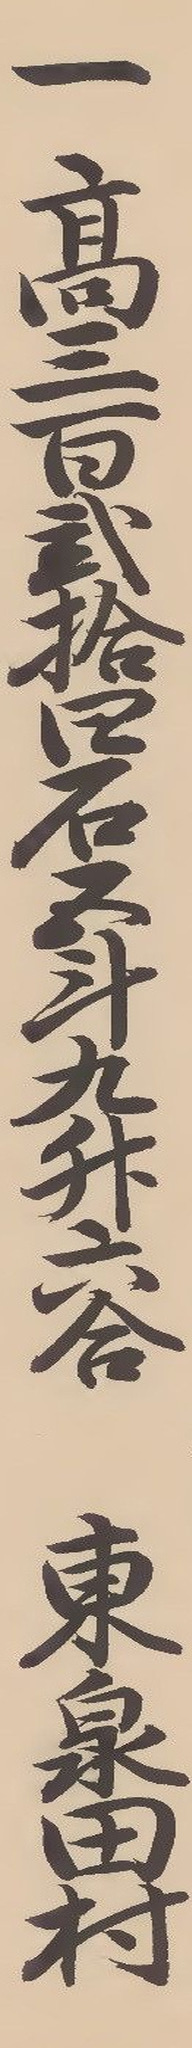一高三百弐拾四石五斗九升六合東泉田村
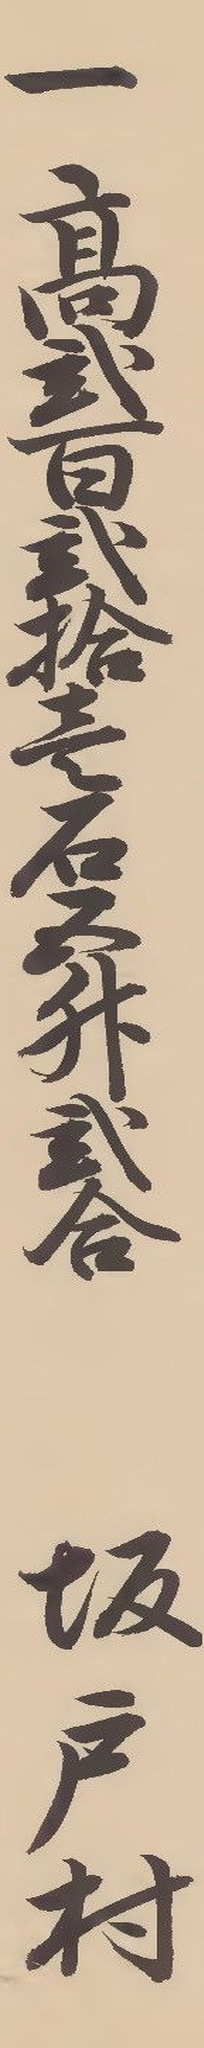一高弐百弐拾壱石五升弐合坂戸村
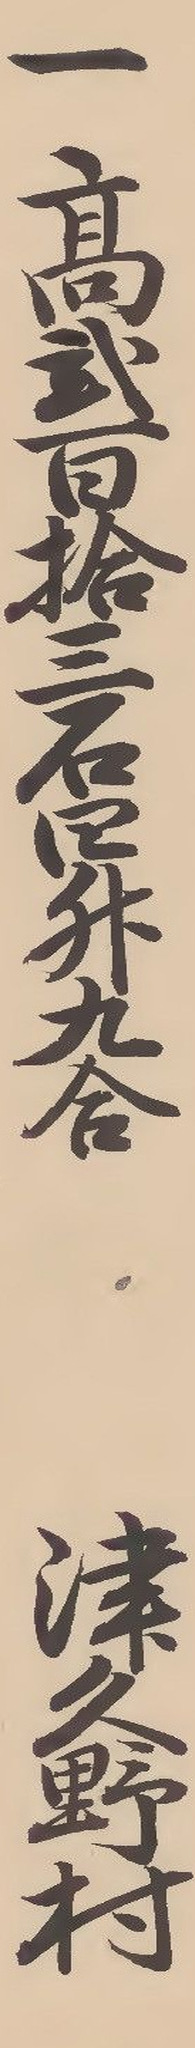一高弐百拾三石四升九合津久野村

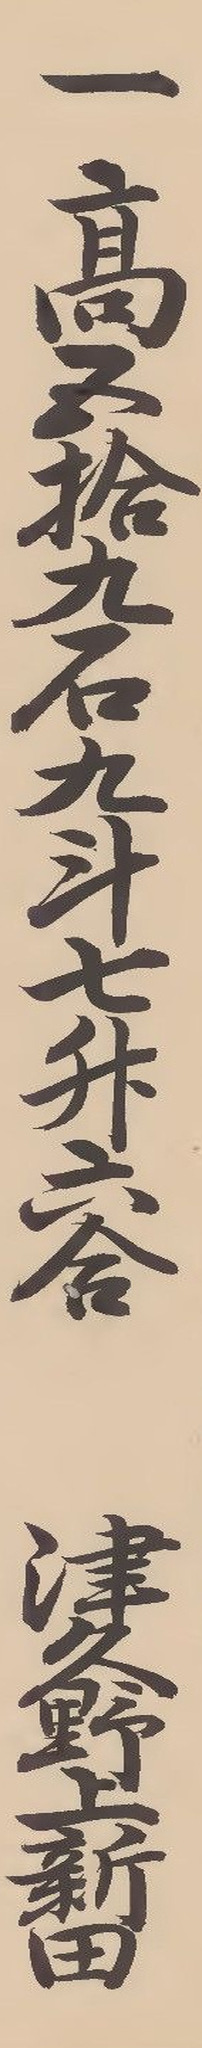一高五拾九石九斗七升六合津久野上新田
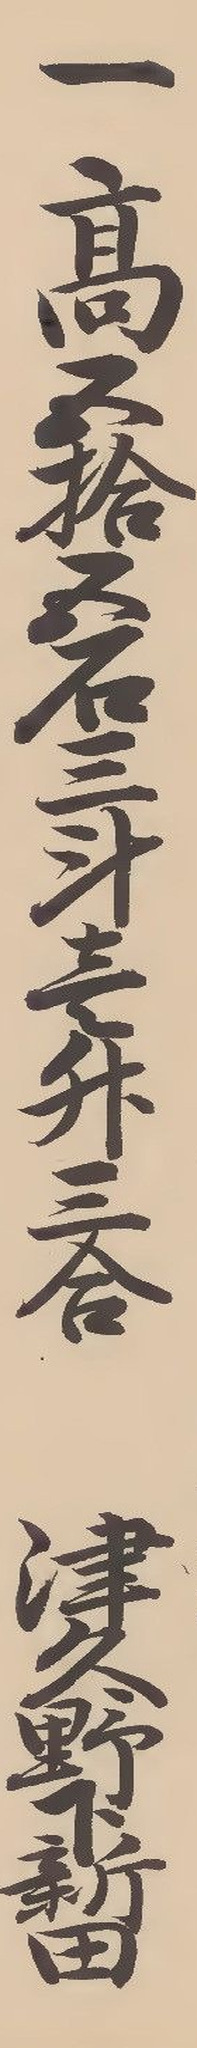一高五拾五石三斗壱升三合津久野下新田
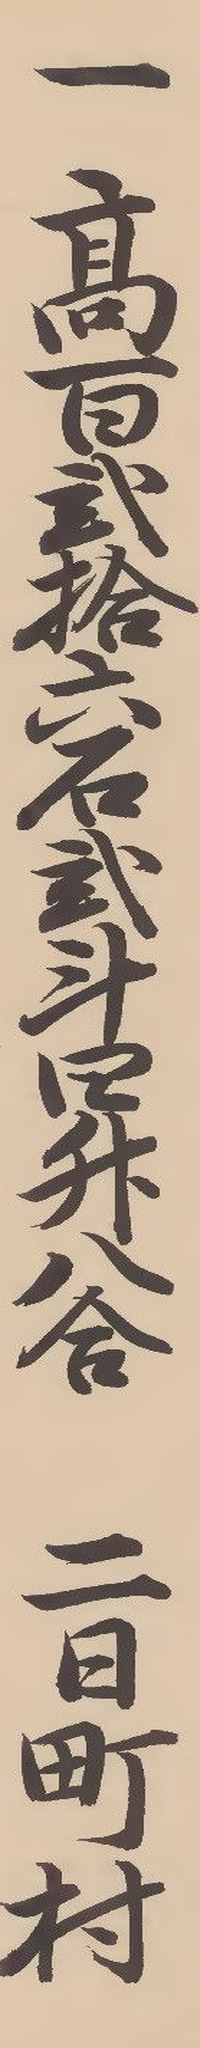一高百弐拾六石弐斗四升八合二日町村
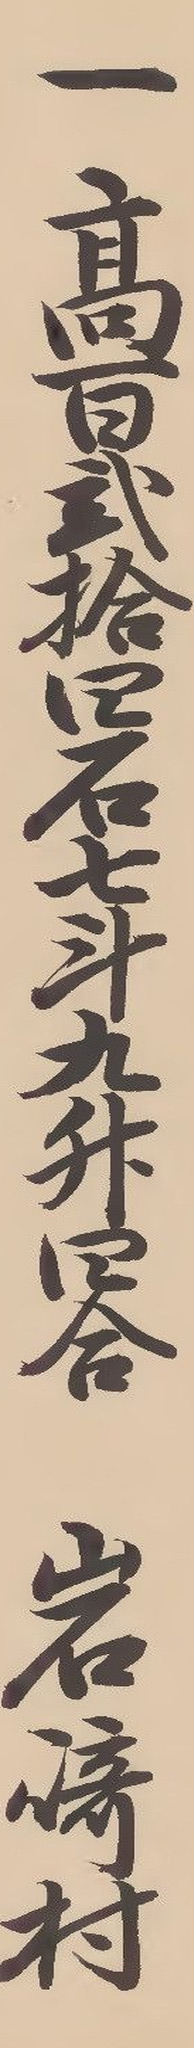一高百弐拾四石七斗九升四合岩崎村
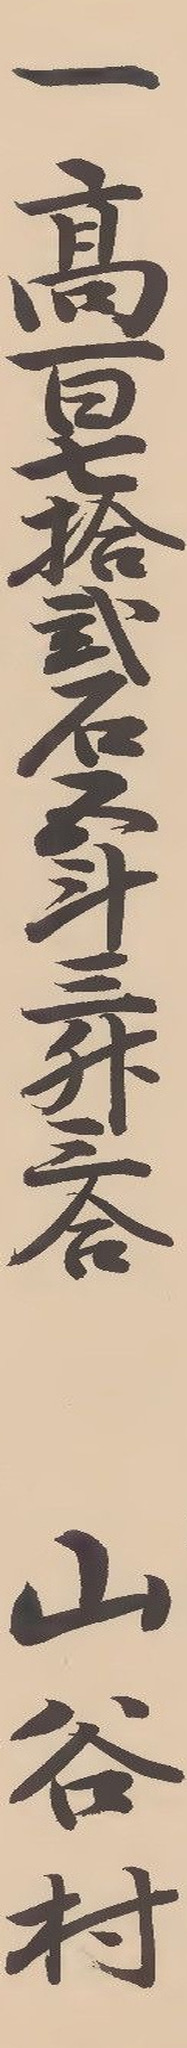一高百七拾弐石五斗三升三合山谷村
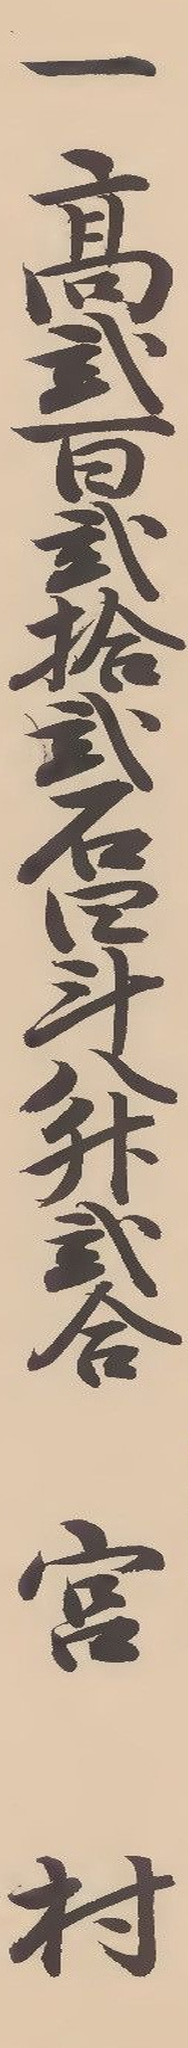一高弐百弐拾弐石四斗八升弐合宮村
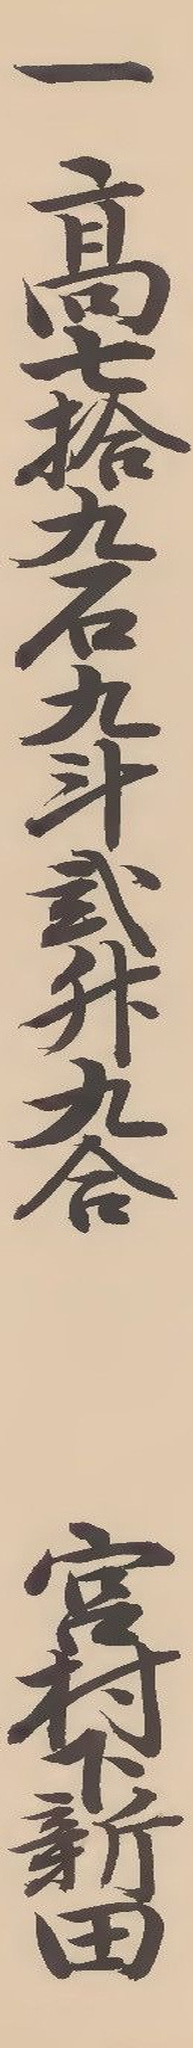一高七拾九石九斗弐升九合宮村下新田
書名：越後国郷帳　中
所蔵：国立公文書館 National Archives of Japan
